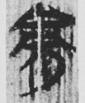骨
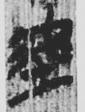○（吾）
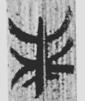未
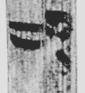又（有）
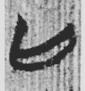㠯
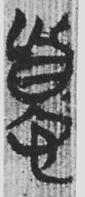○（憂→優）
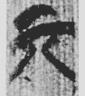亓
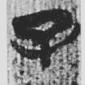子
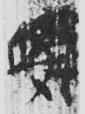○（脽）
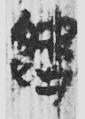既
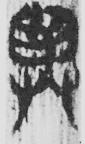與
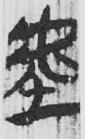○（吾）
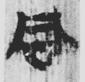同
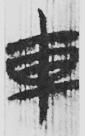車
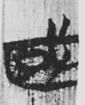或（又）
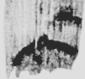○（余→予）
